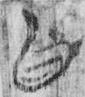目
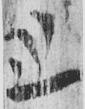之
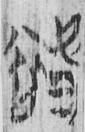欲
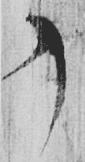人
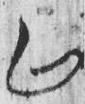㠯（以）
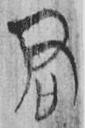君
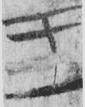王
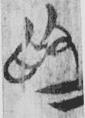爲
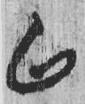㠯（以）
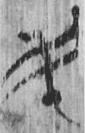民
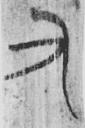又（有）
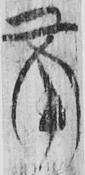不
